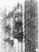金
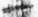一
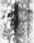才（在）
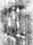{匚去}
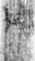{阝咸}
